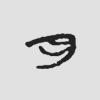月
